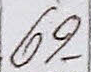69
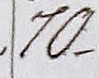70
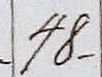48
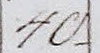40
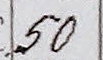50
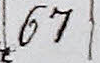67
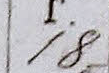18
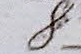8
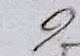9
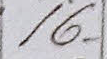16
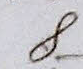8
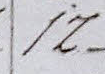12
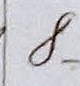8
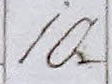10
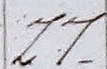27
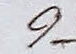9
